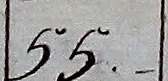55.
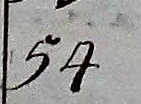54
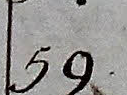59
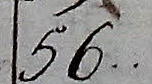56.
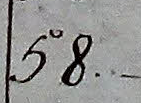58.
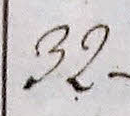32
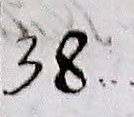38.
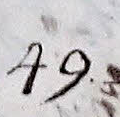49
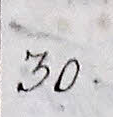30
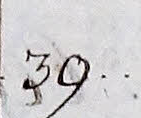39.
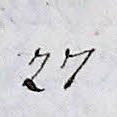27
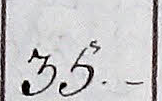35.
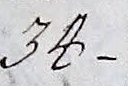34
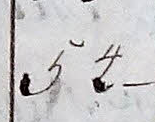54
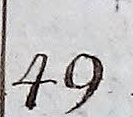49
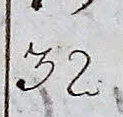32
